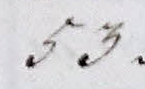53
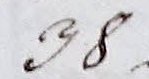38
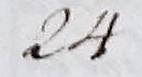24
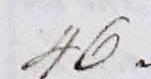46
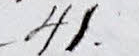41.
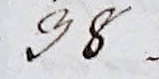38
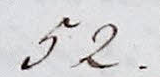52
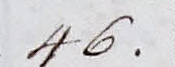46.
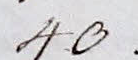40
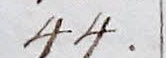44.
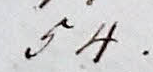54
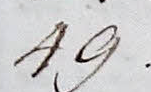49
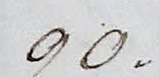90
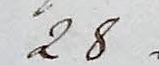28
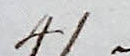41
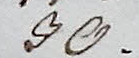30
